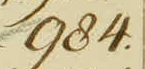984.
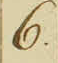6.
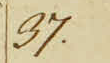37.
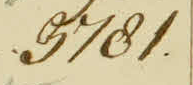3781.
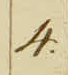4.
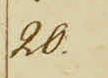20.
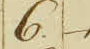6.
